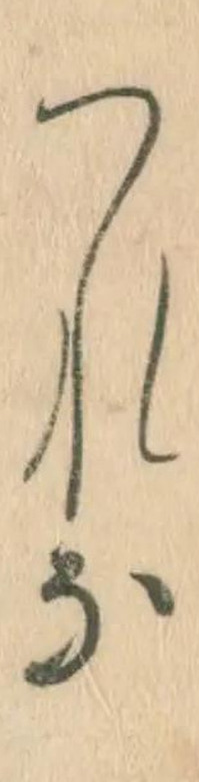つれな
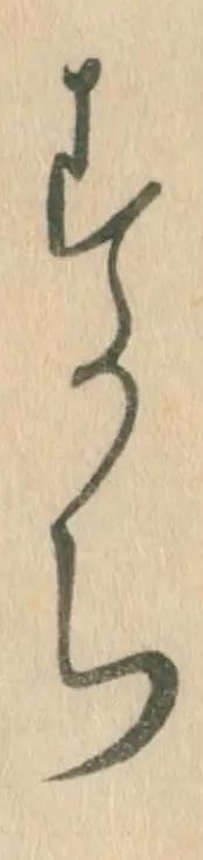すから
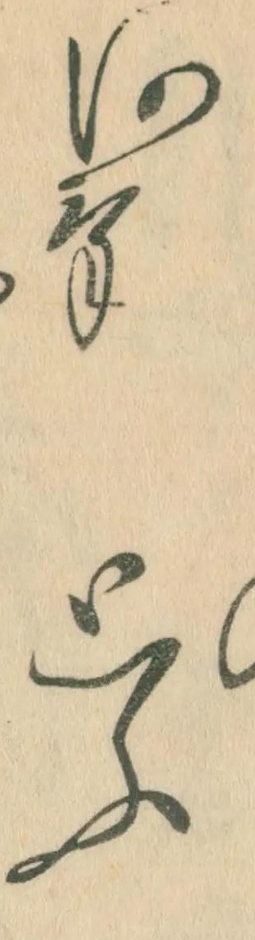あけ思ふ
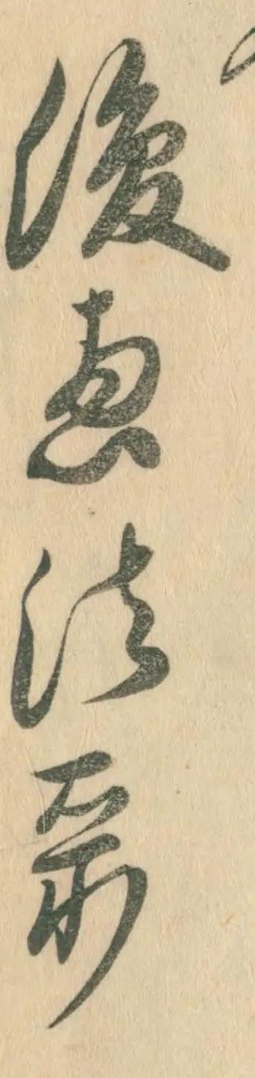俊恵法師

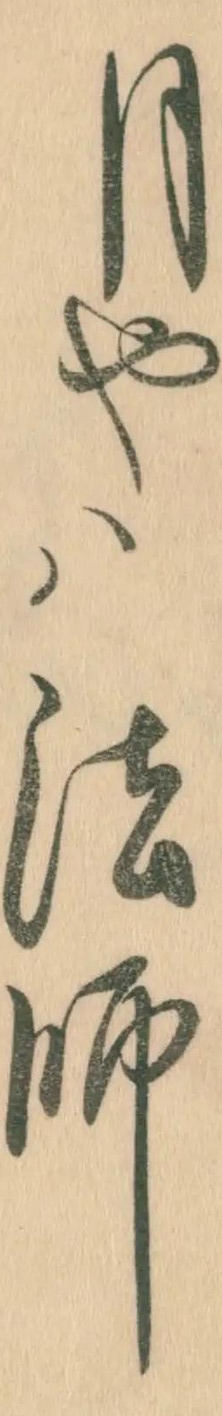月やは法師
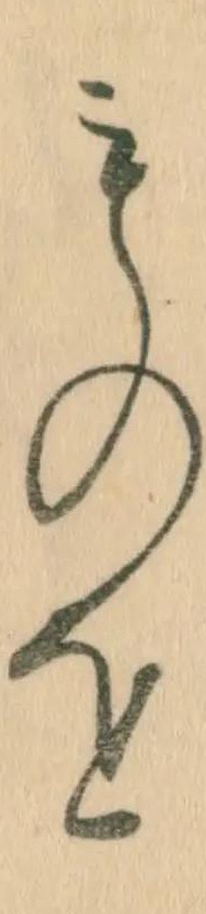ものを
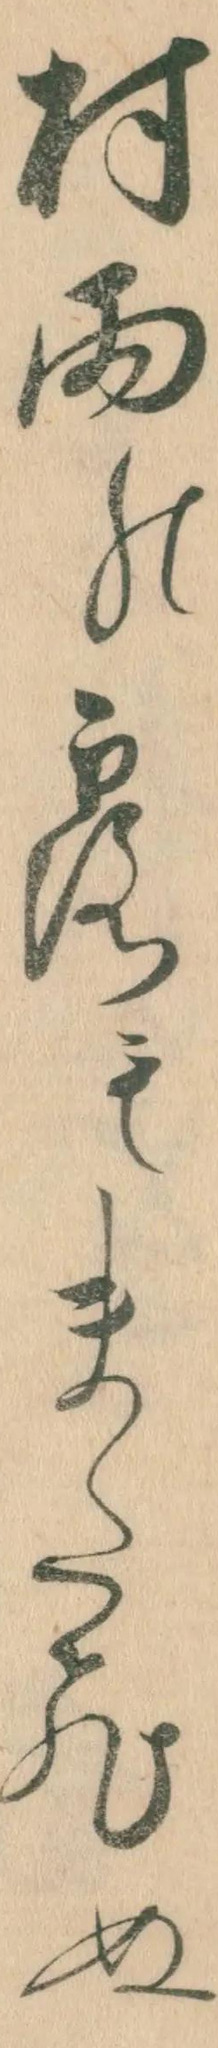村雨の露もまたひぬ
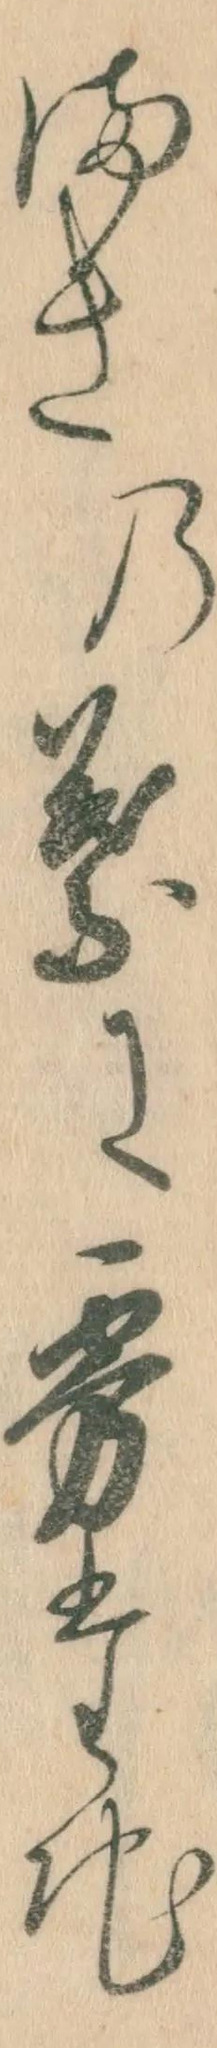まきの葉に霧たち

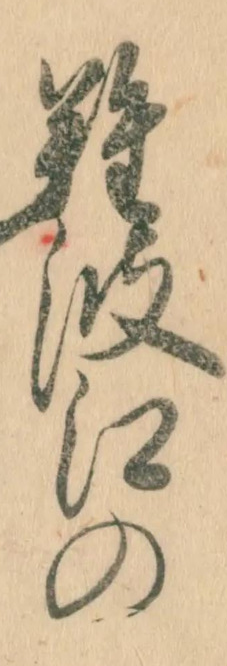難波江の
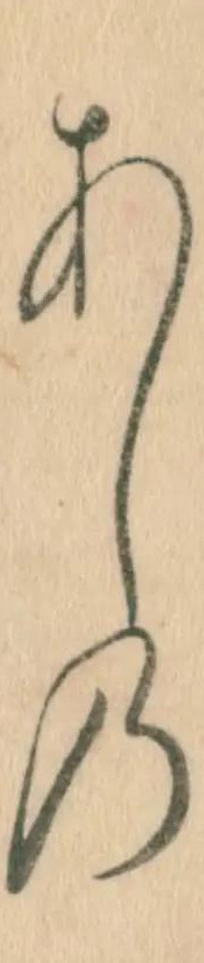あしの
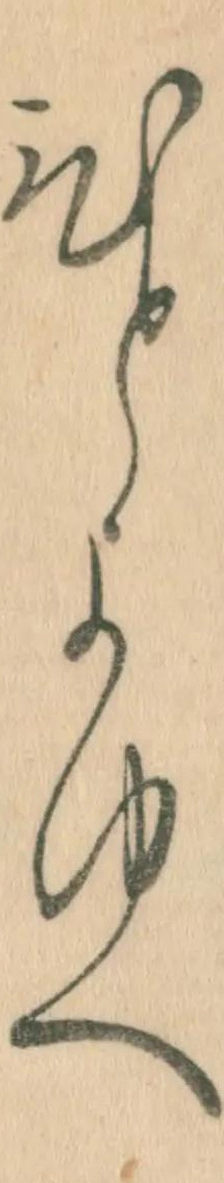ひとよゆへ
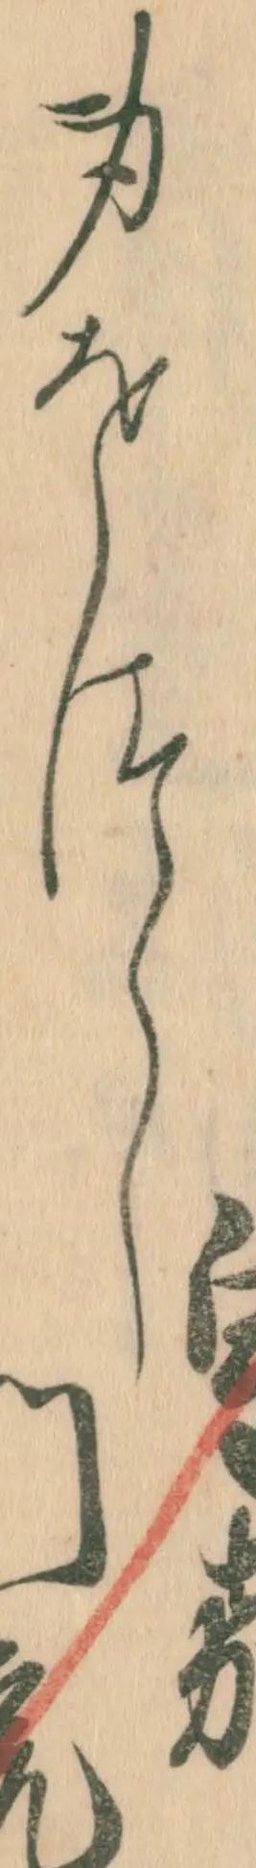身をつくし
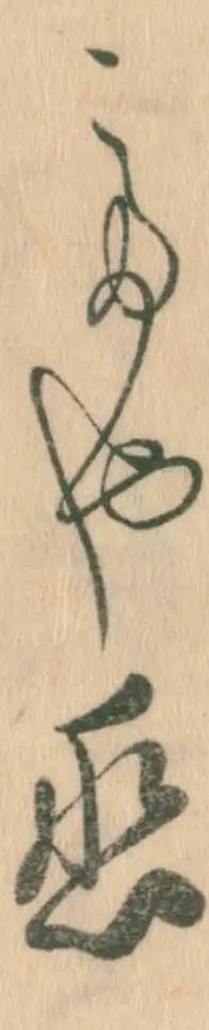てや恋
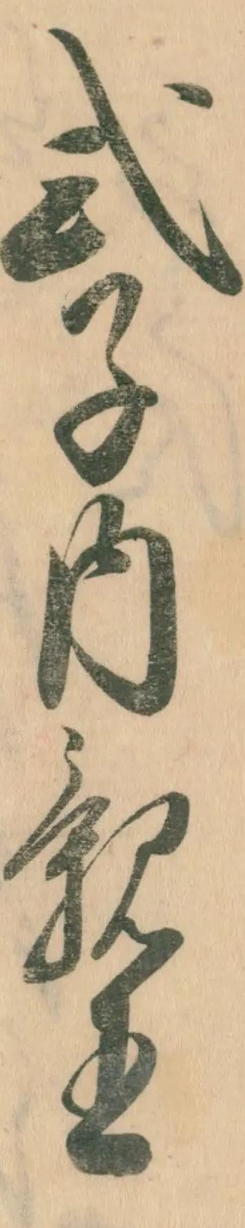式子内親王
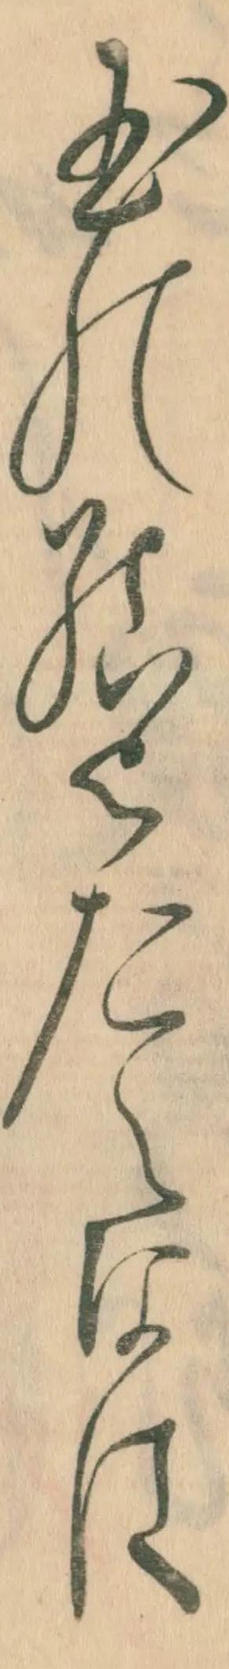玉の緒よたえなは
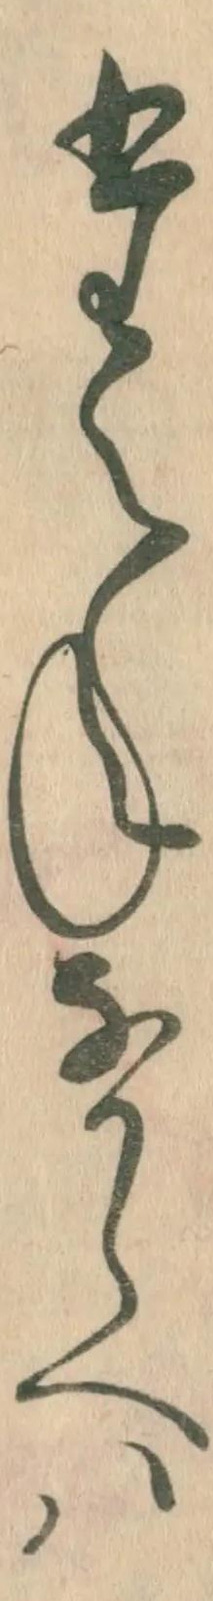たえねなからへは
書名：錦百人一首あつま織
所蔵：国立国会図書館 National Diet Library, JAPAN
